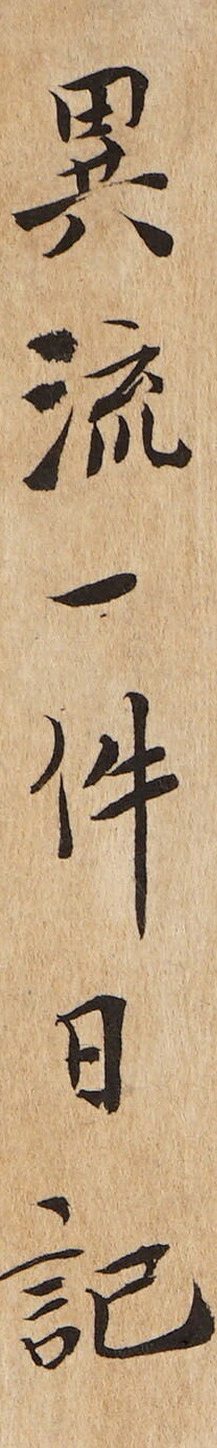異流一件日記

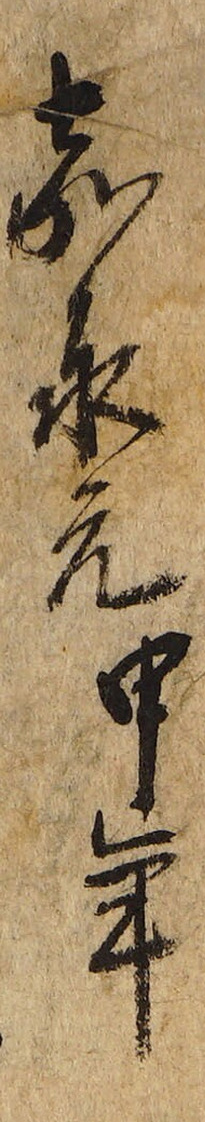嘉永元申年
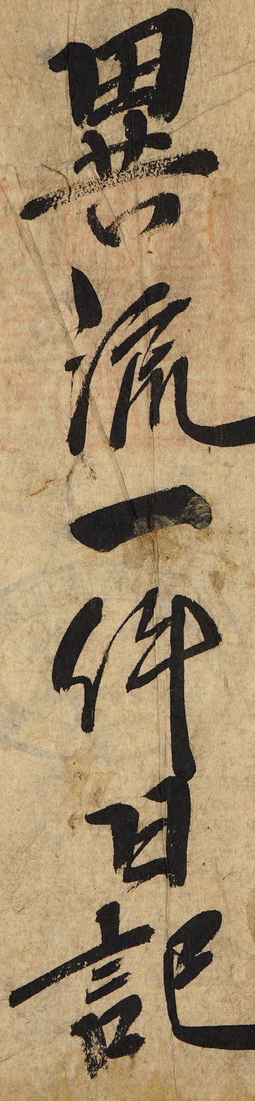異流一件日記
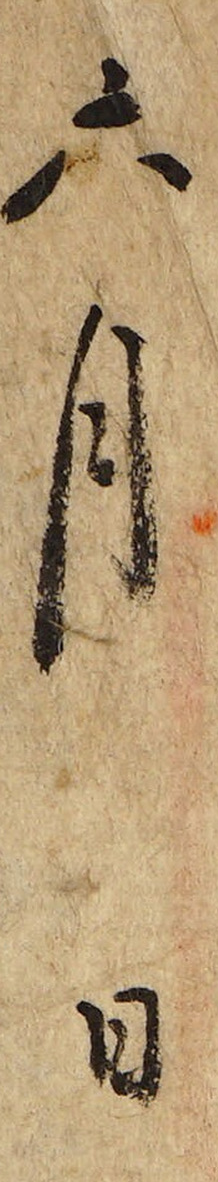六月日

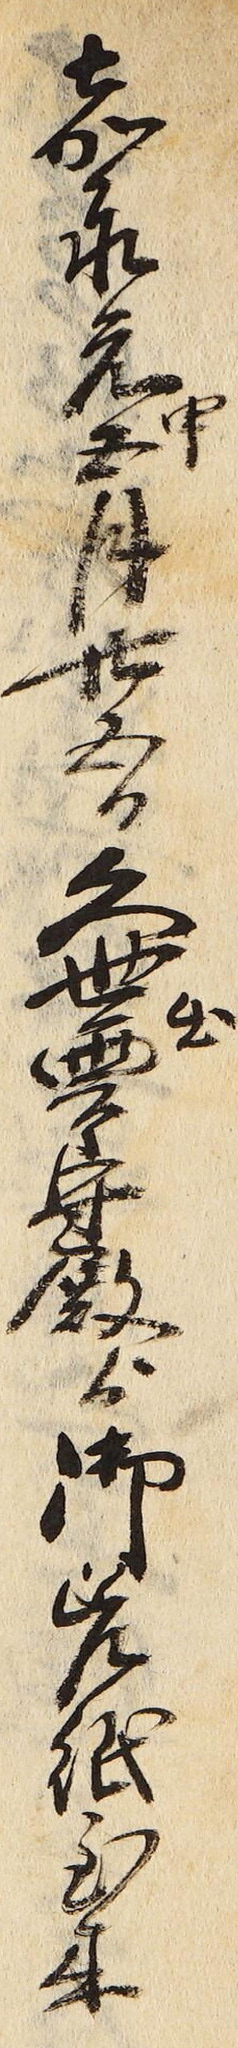嘉永元申五月廿五日久世出雲守殿ゟ御差紙到来
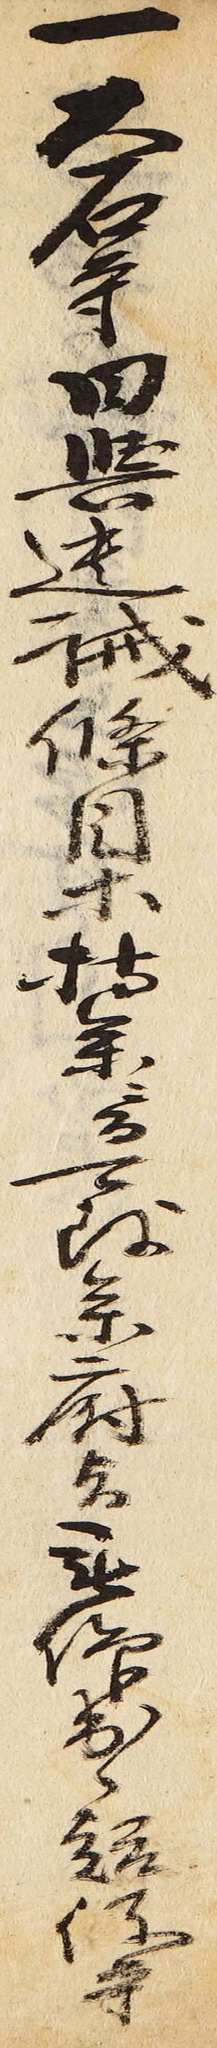一大石寺日興遺誡條目等持参に而可致参府旨被仰出候趣役寺
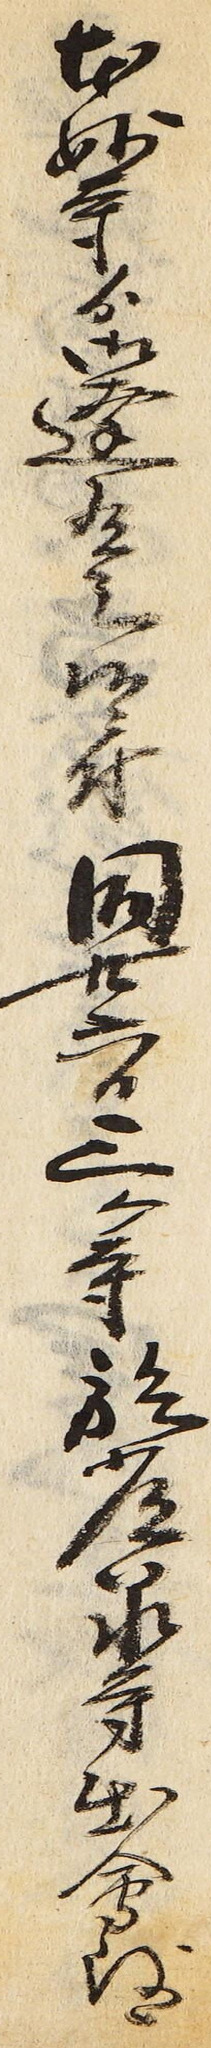本妙寺ゟ御達有之候に付同廿六日三ケ寺於常泉寺出会致候
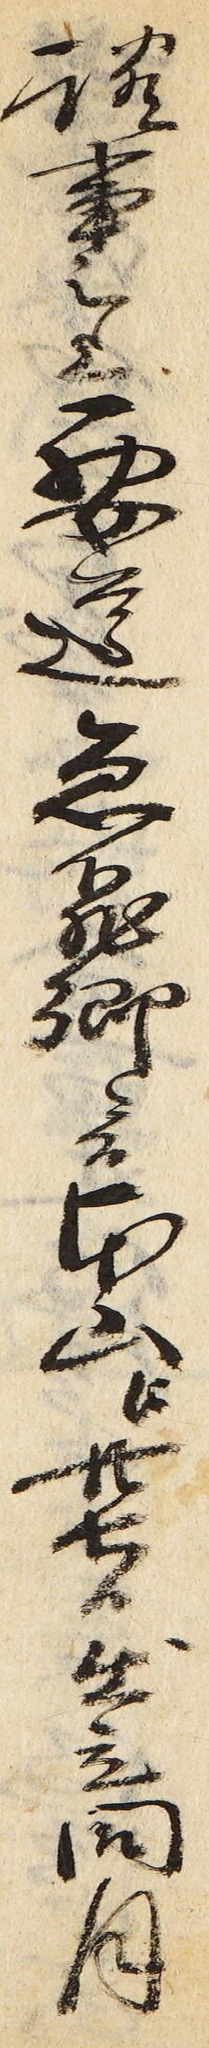談事之上要遵急飛脚に而本山江廿七日出立同月
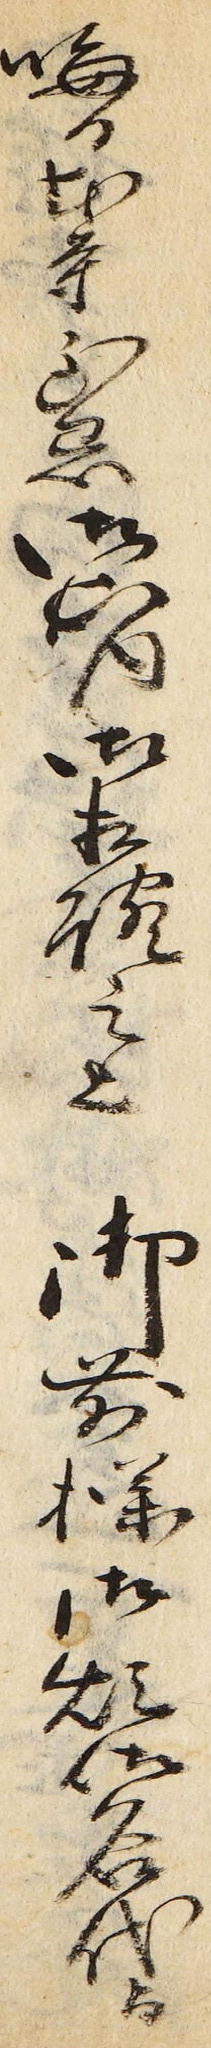晦日本寺到着御山内御相談之上御前様御煩御名代と
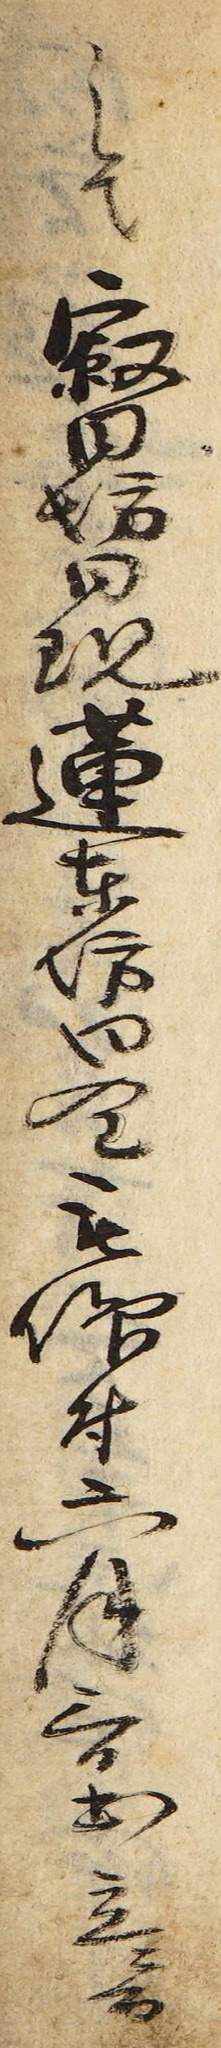して寂日坊日現蓮東坊日全被仰付六月三日出立に而

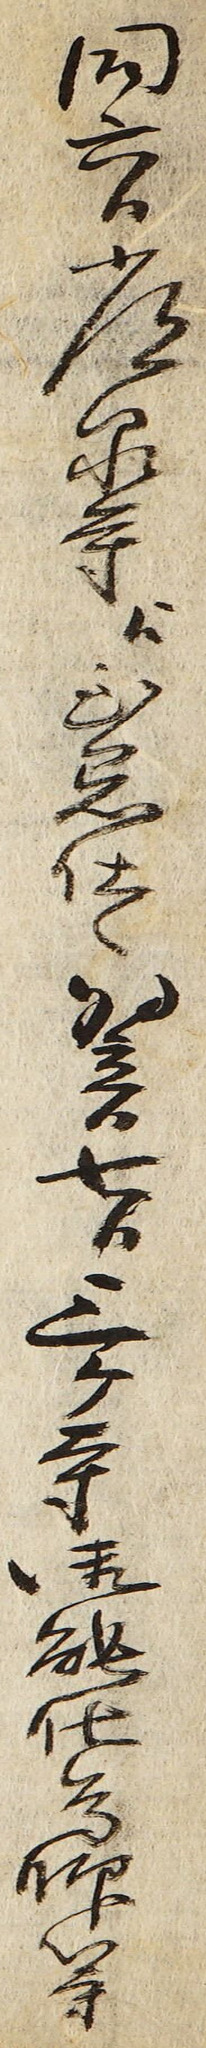同六日常泉寺江到着仕候翌日七日三ケ寺御触仕尊師等
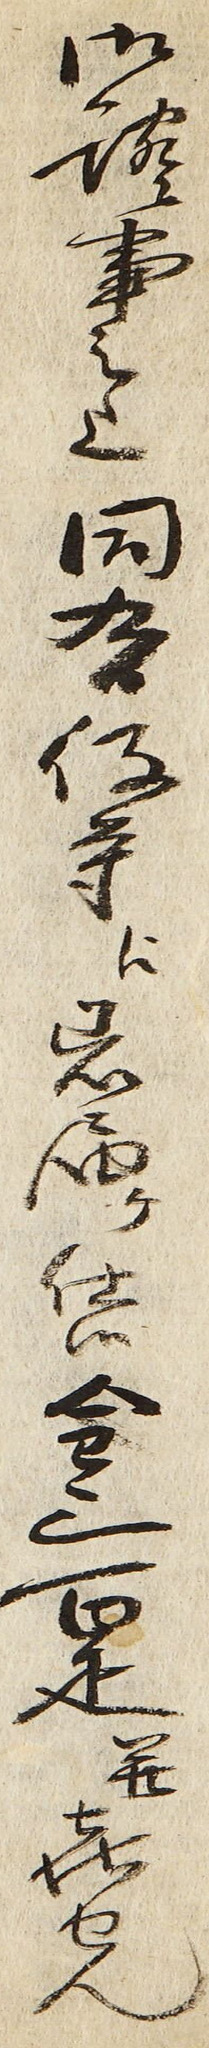御談事之上同九日役寺江着届ケ仕候金三百疋并喜せん
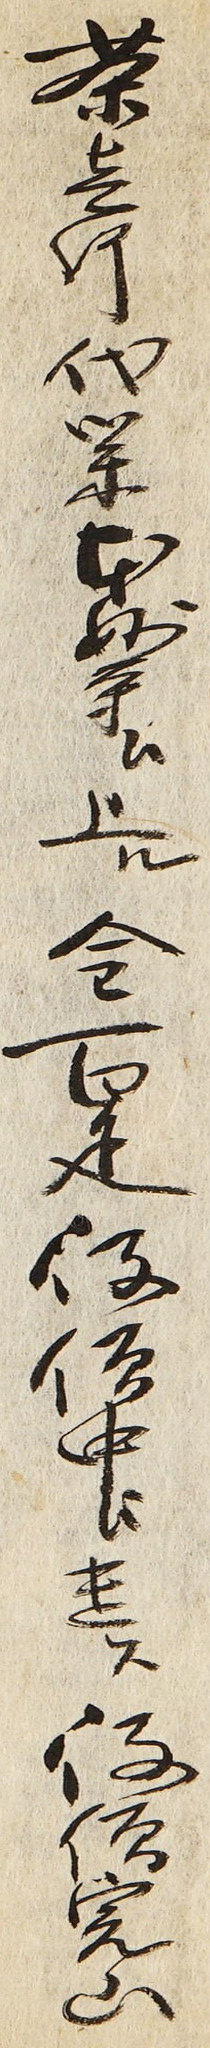茶壱斤代参本妙寺江上ル金百疋役僧中江遣ス役僧完山
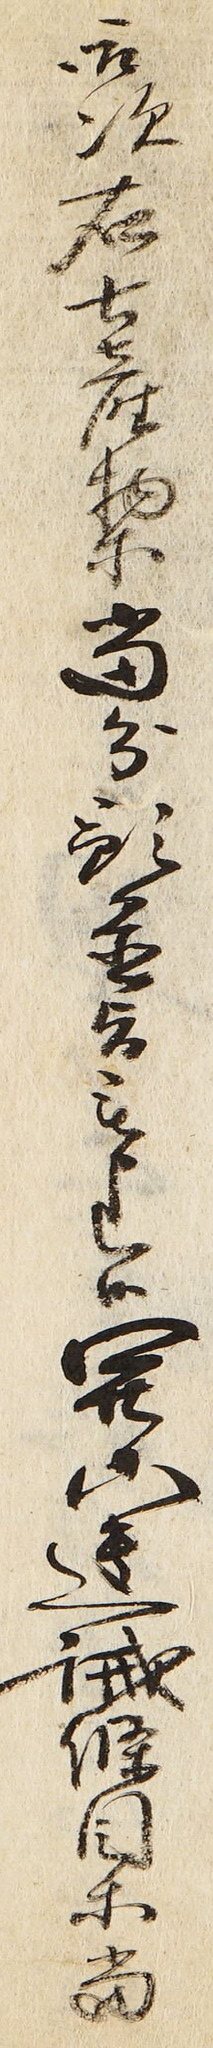取次右土産物等当分預置旨被申上候開山遺誡條目等当
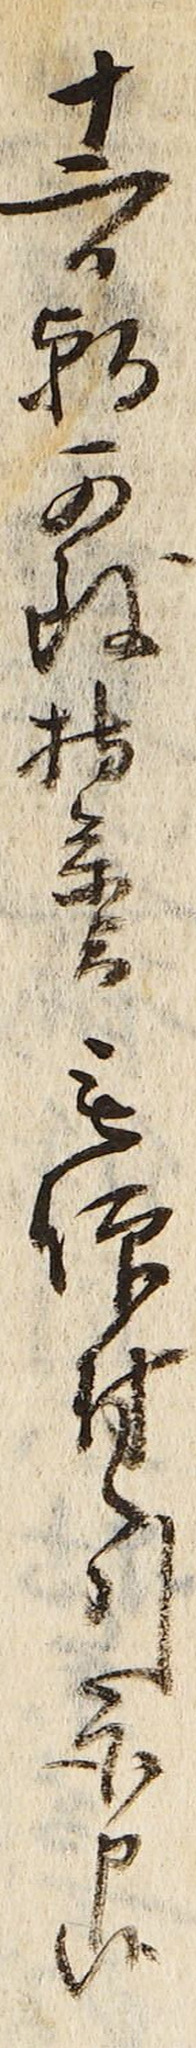十二日朝可致持参旨被仰付引取申候
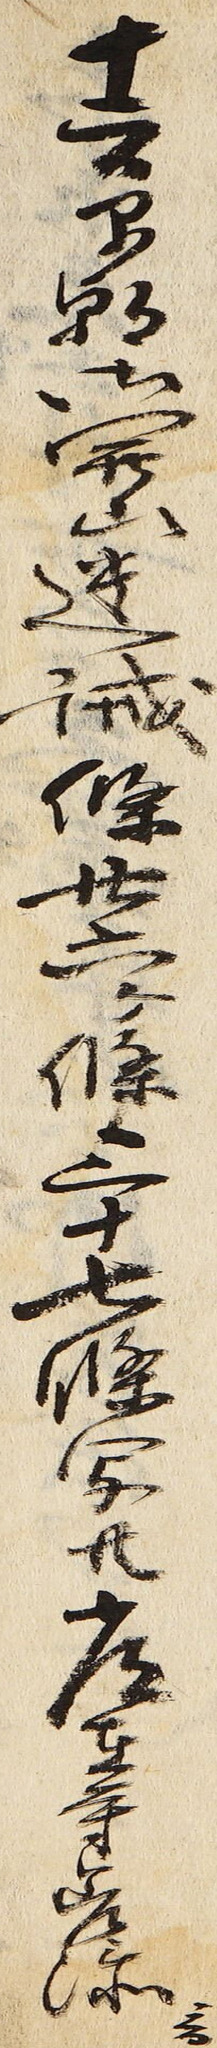十二日早朝御開山遺誡條廿六ケ條三十七條写共常在寺差添に而
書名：異流一件日記
